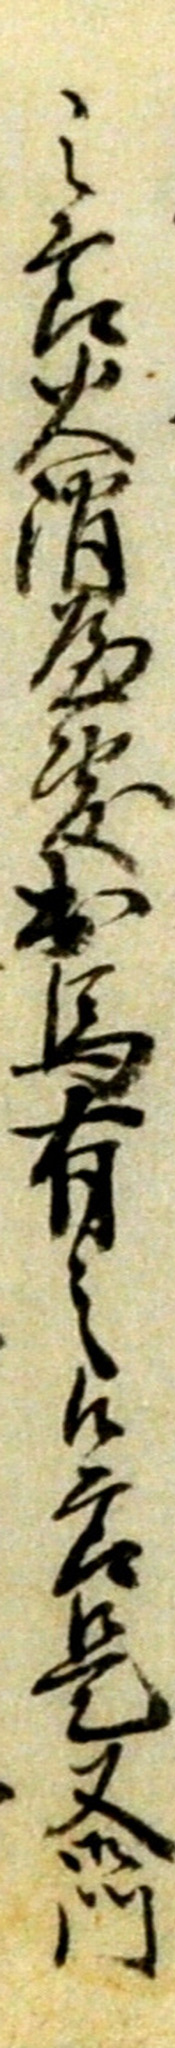之節火消屋敷出馬有之候節是又御門
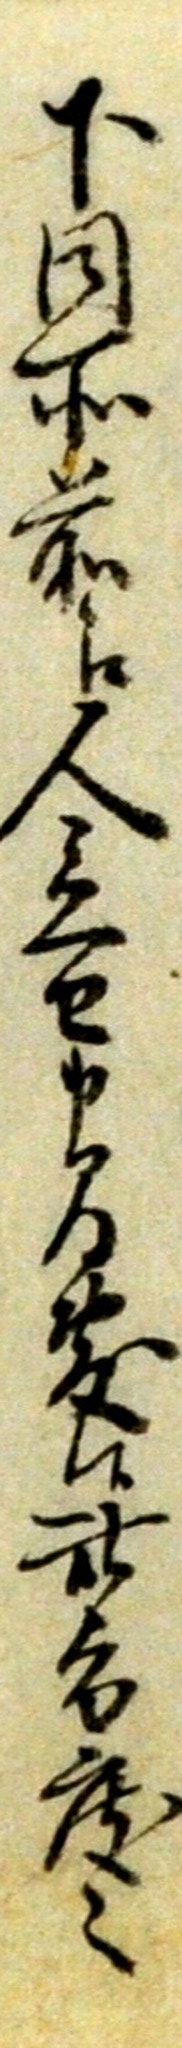下同所前江人立由申間敷候此旨度々
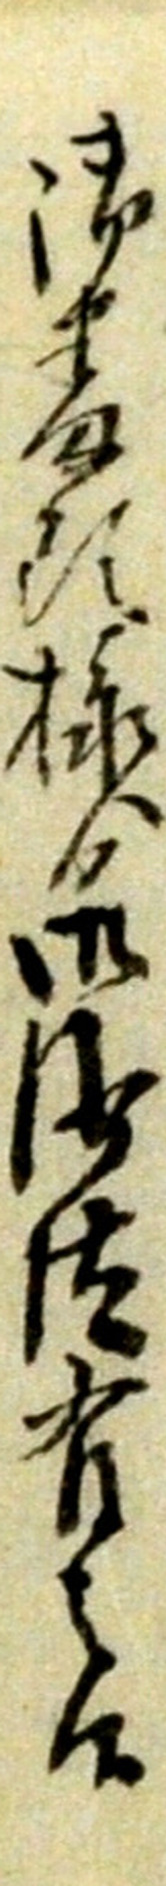御番頭様ゟ御沙汰有之候
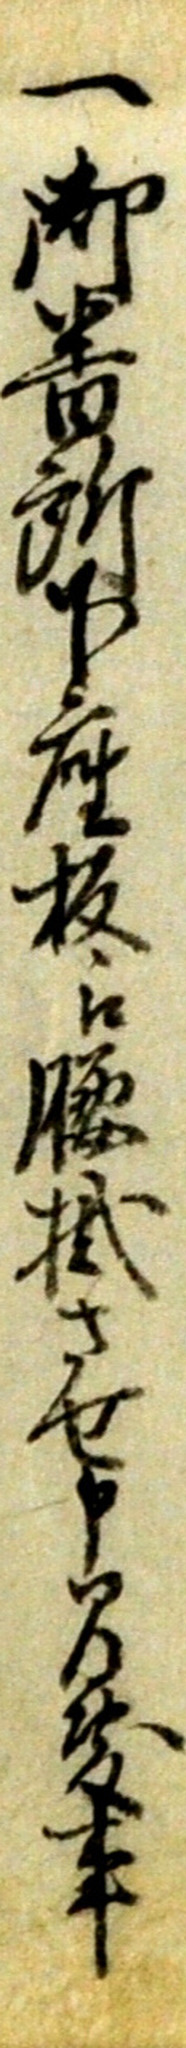一御番頭下座板江腰掛さｓさせ申間敷事
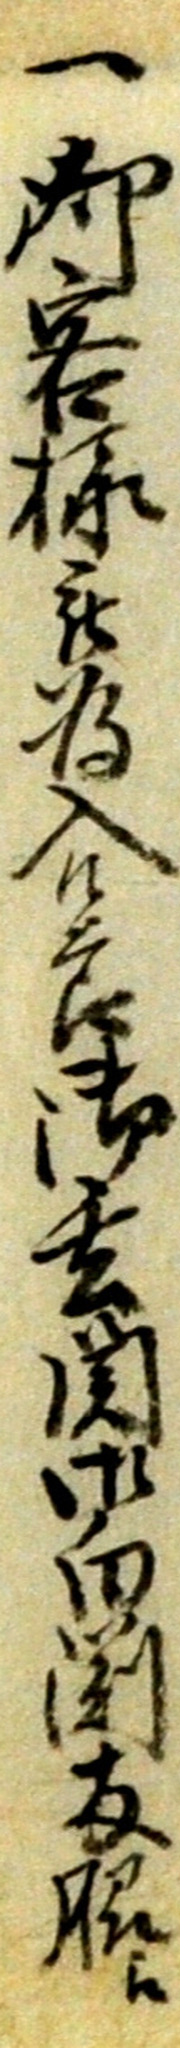一御客様被為入候節御玄関御白渕両脇江
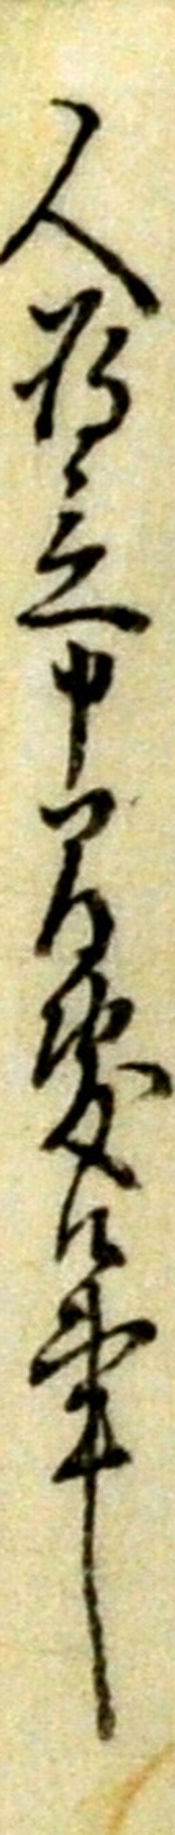人為立申間敷候事

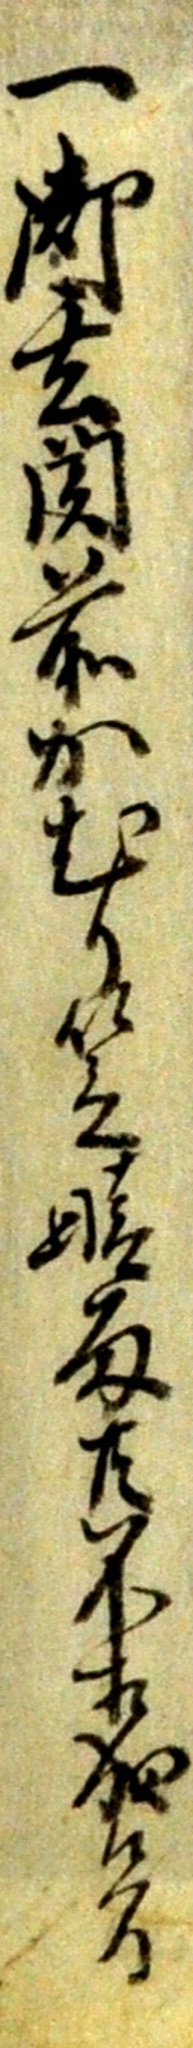御玄関前かむり候立晴雨共不相成候間
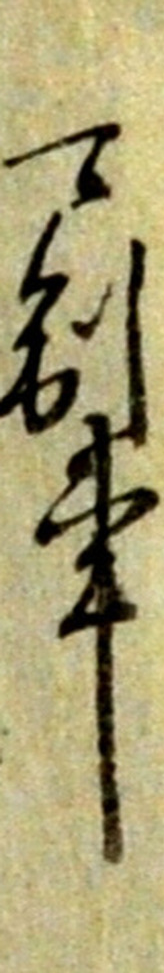可別事
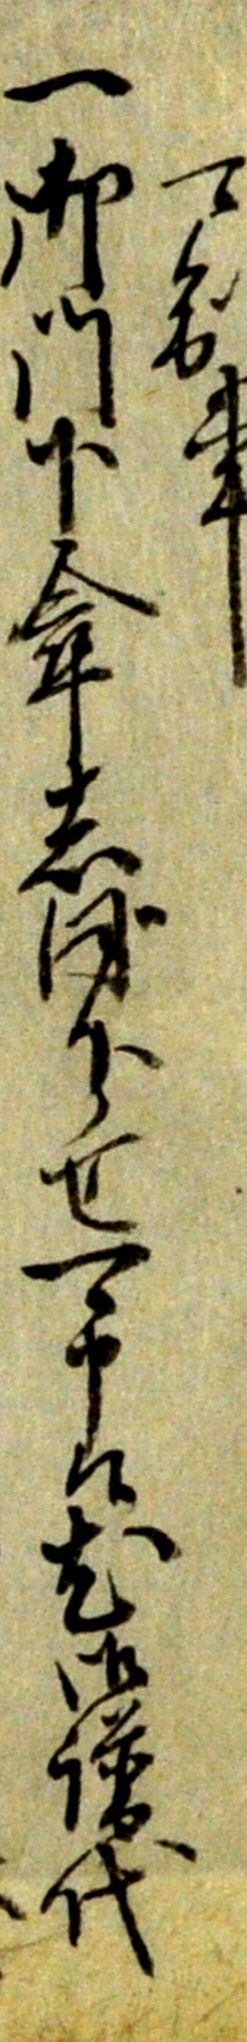一御門下傘しぼらせ可申候尤御譜代
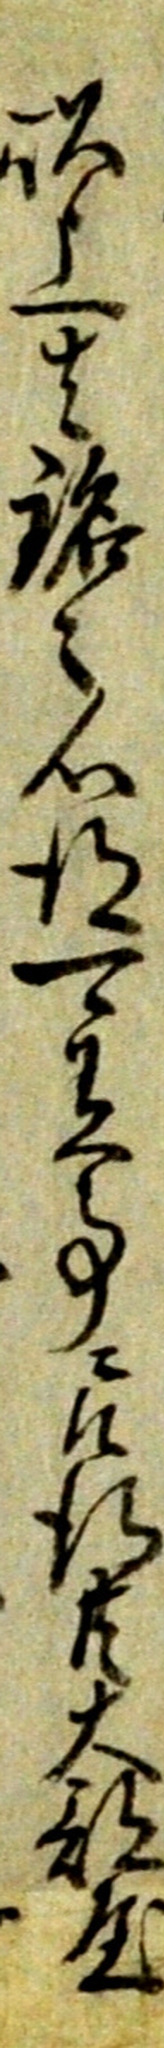以上者銘々心得可有事ニ候得共大部屋
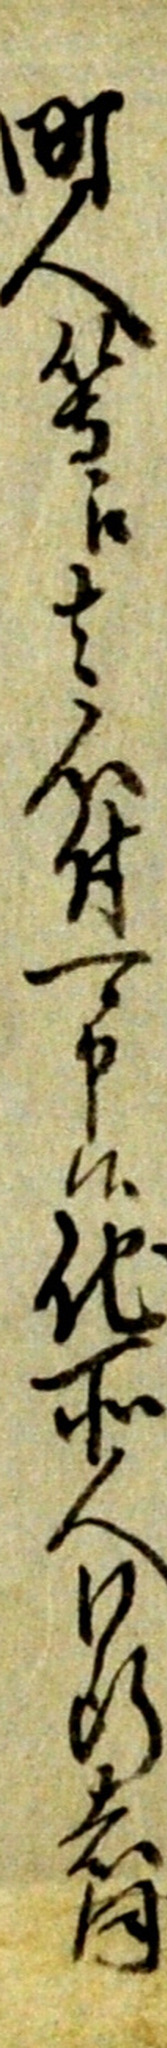町人等江者心付可申候他所人同断しぼ
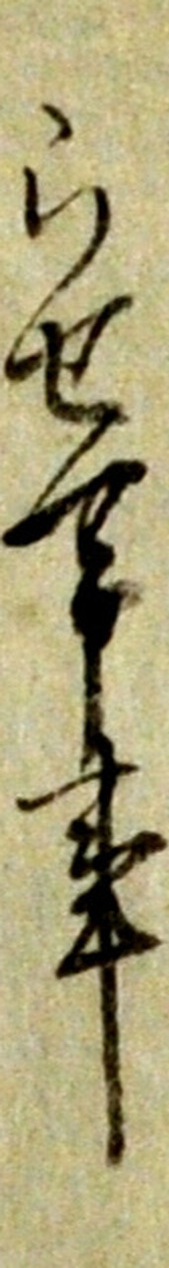らせ可申事
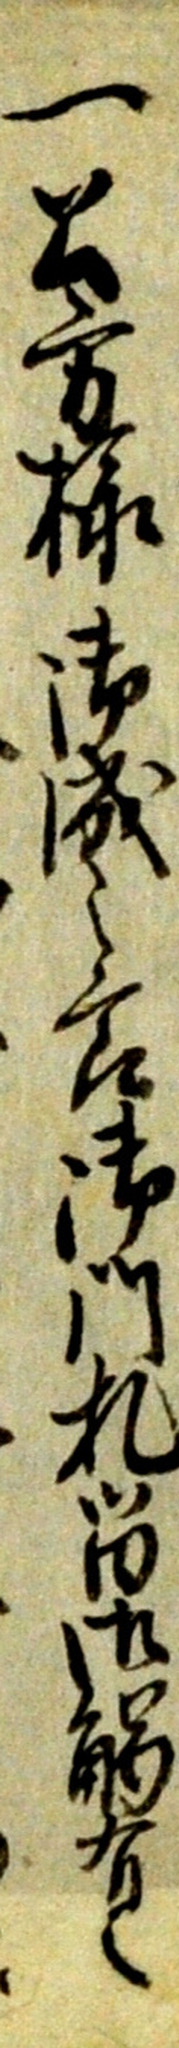一公方様御也之節御門札留御觸有之
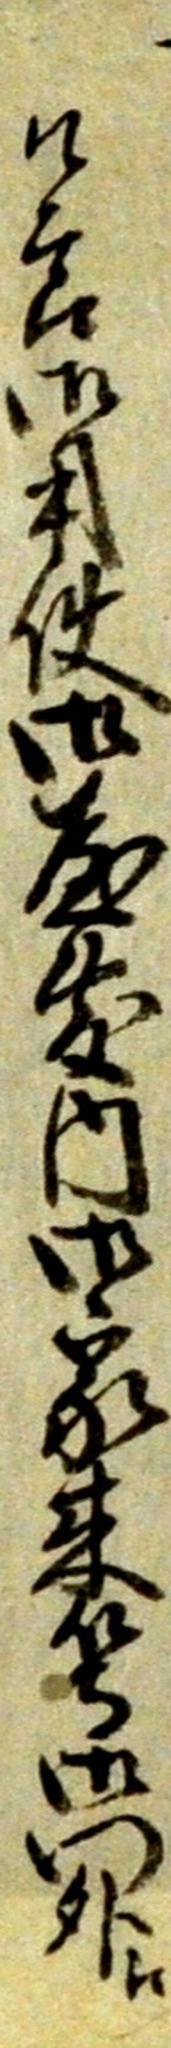候節御用使御屋敷内御家来等御門外江
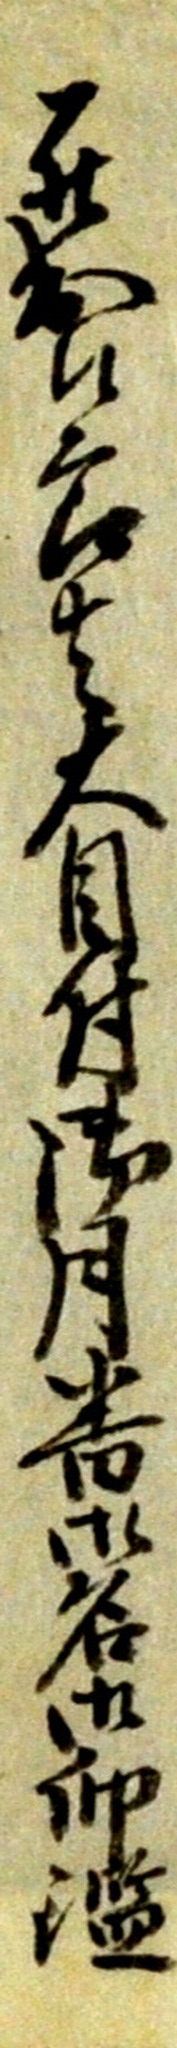罷出候節者大目付御月番御名御印鑑
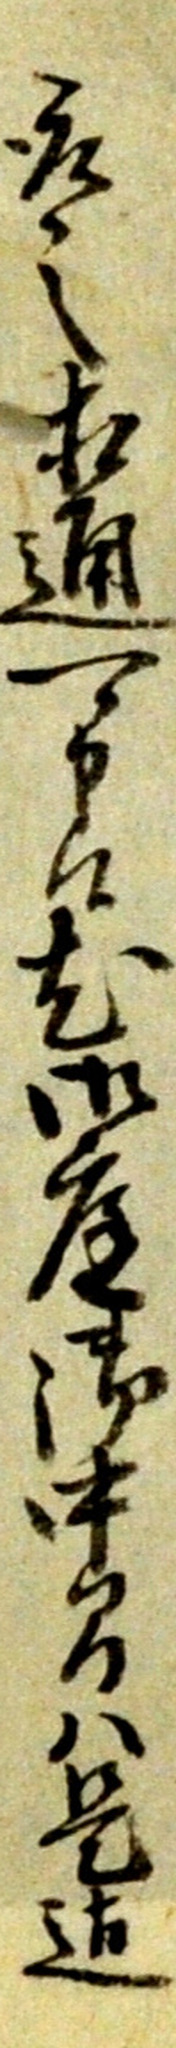取之相通可申候尤御座御中間ハ是迄
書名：御先手組江戸御屋敷御門番勤方
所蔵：伊那市立高遠町図書館・合同会社AMANE
